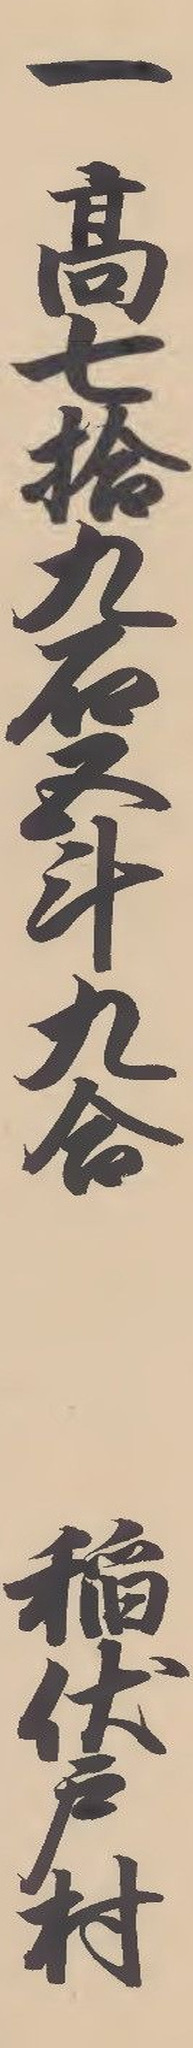一高七拾九石五斗九合稲伏戸村
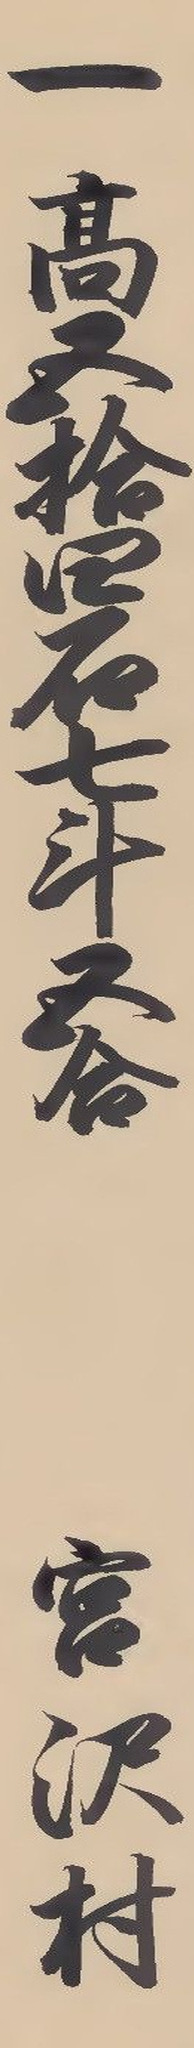一高五拾四石七斗五合宮沢村
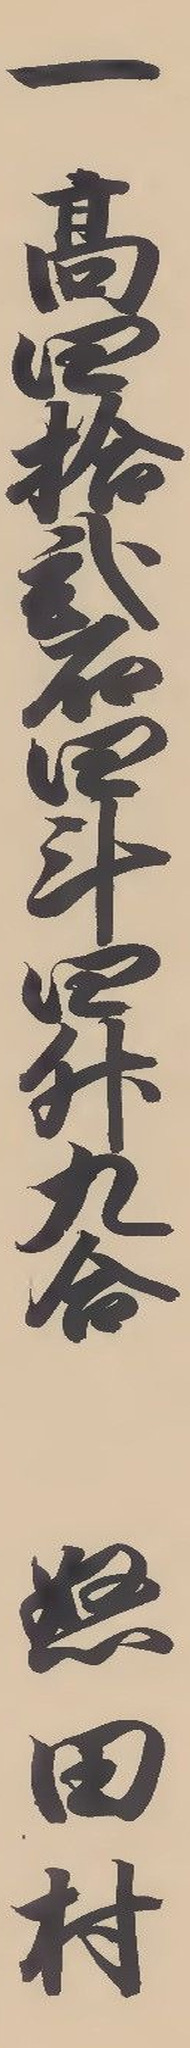一高四拾弐石四斗四升九合怒田村
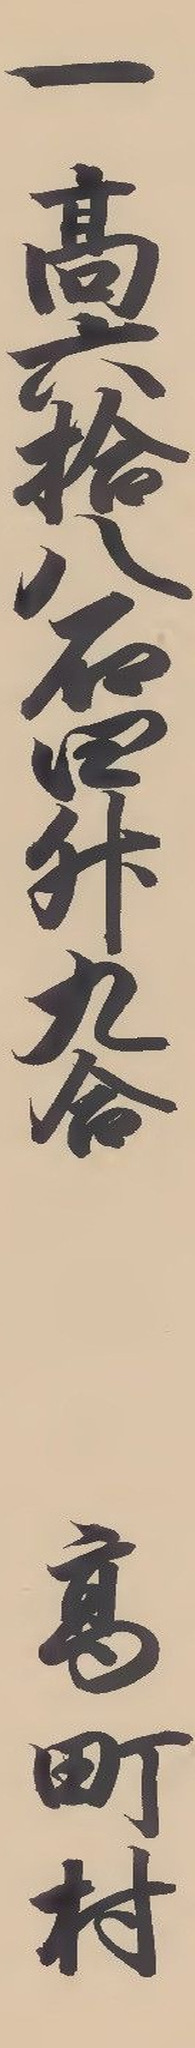一高六拾八石四升九合高町村
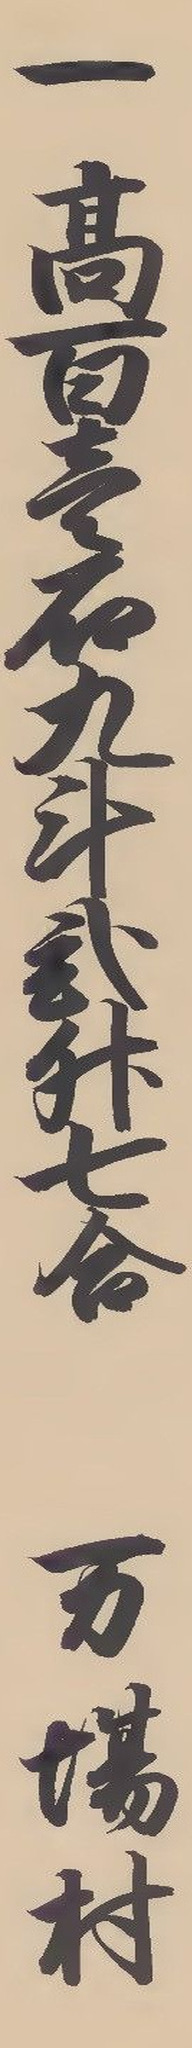一高百壱石九斗弐升七合万場村

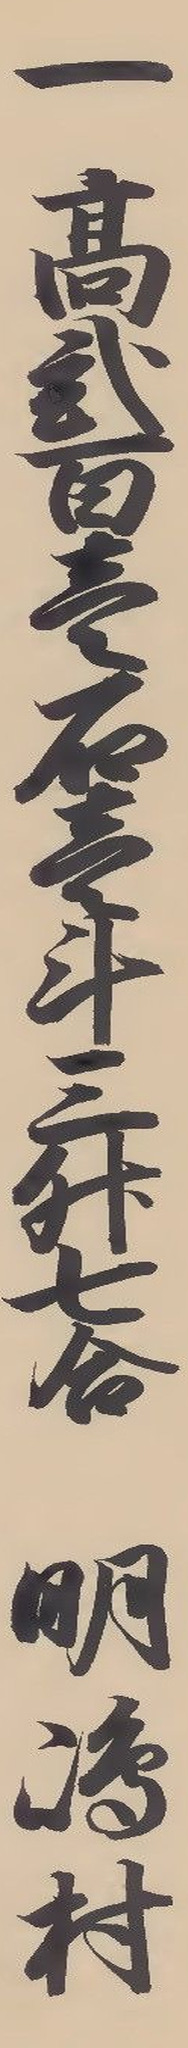一高弐百壱石壱斗三升七合明島村
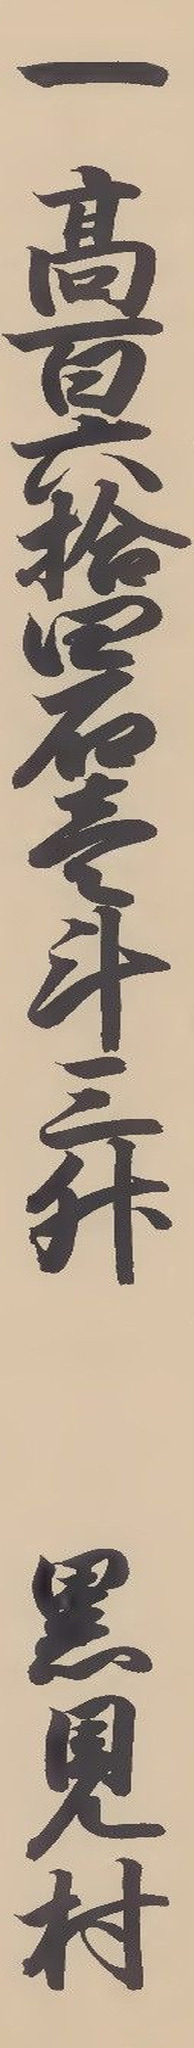一高百六拾四石壱斗三升黒見村
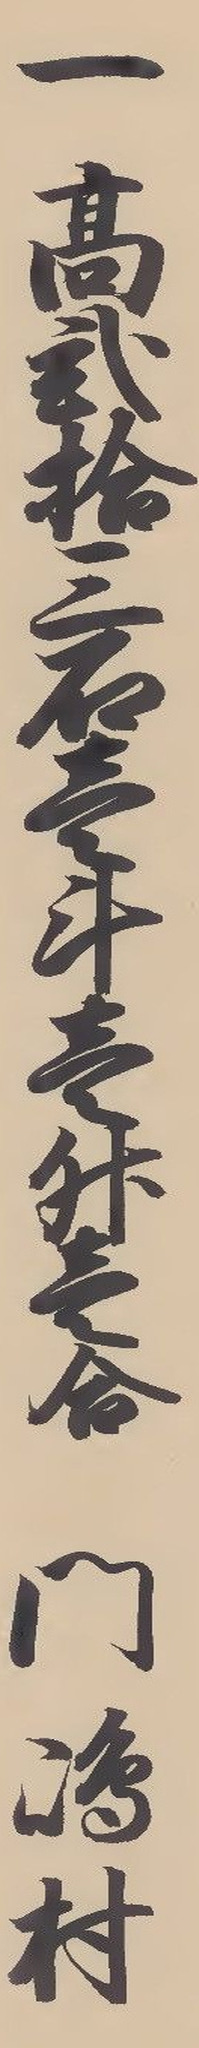一高弐拾三石壱斗壱升壱合門島村
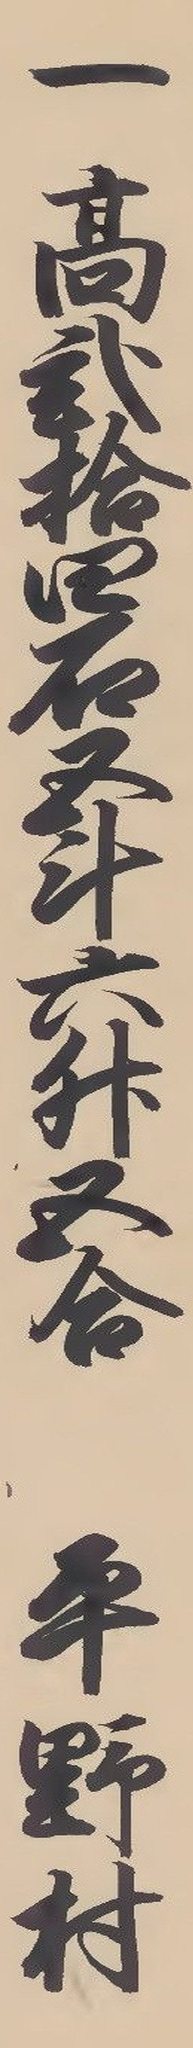一高弐拾四石五斗六升五合平野村
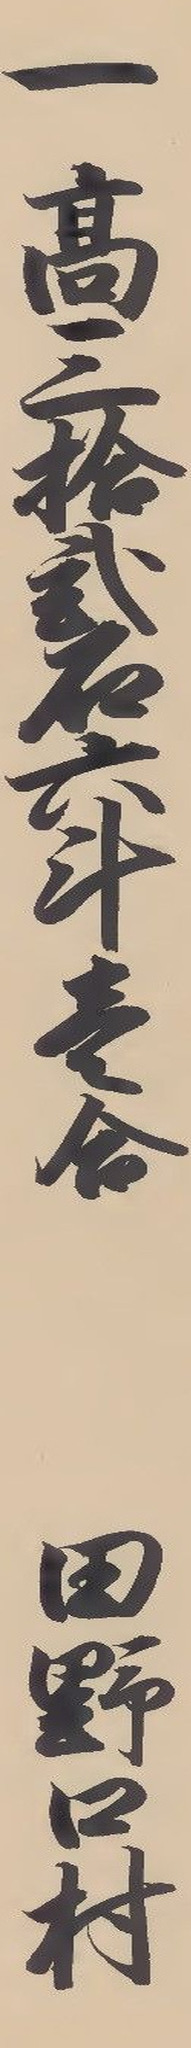一高三拾弐石六斗壱合田野口村
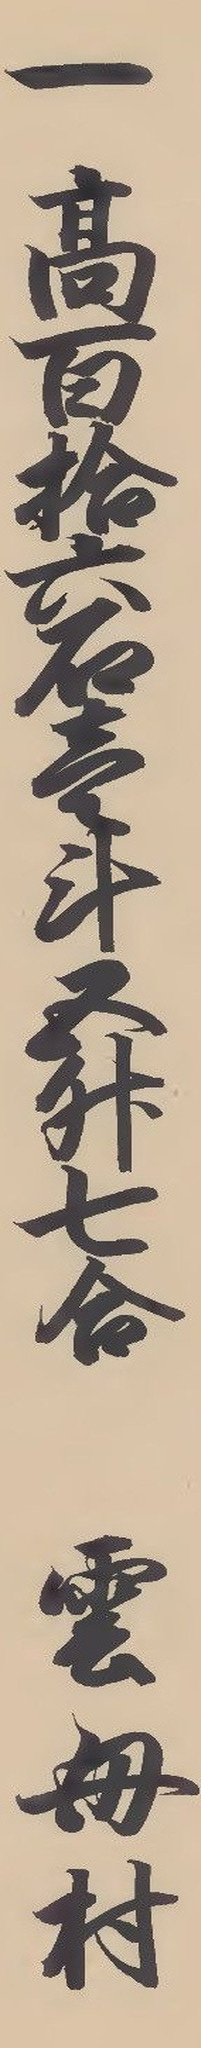一高百拾六石壱斗五升七合雲母村
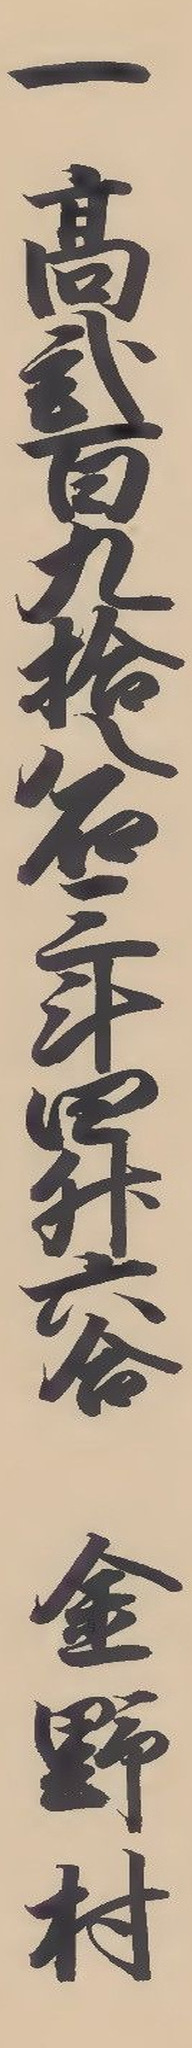一高弐百九拾八石三斗四升六合金野村

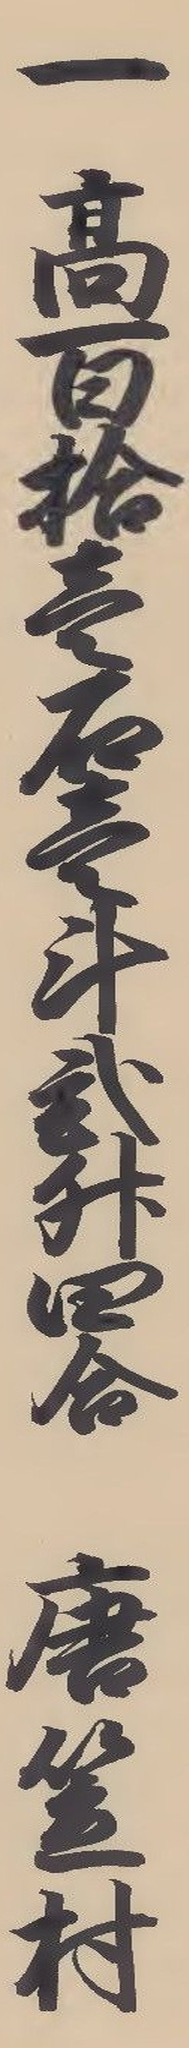一高百拾壱石壱斗弐升四合唐笠村
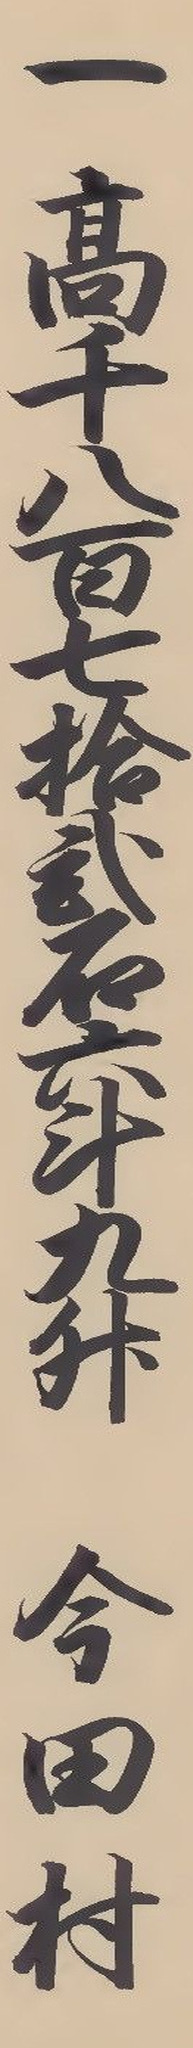一高千八百七拾弐石六斗九升今田村
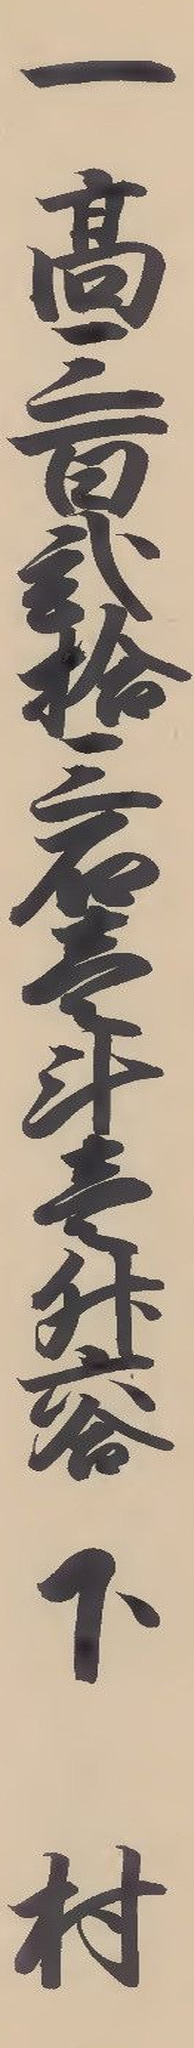一高三百弐拾三石壱斗壱升六合下村
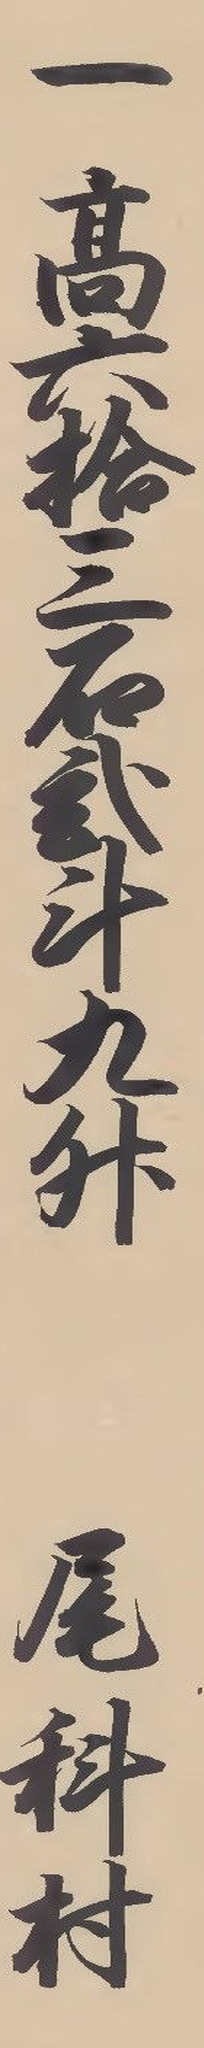一高六拾三石弐斗九升尾科村
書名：信濃国郷帳
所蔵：国立公文書館 National Archives of Japan
